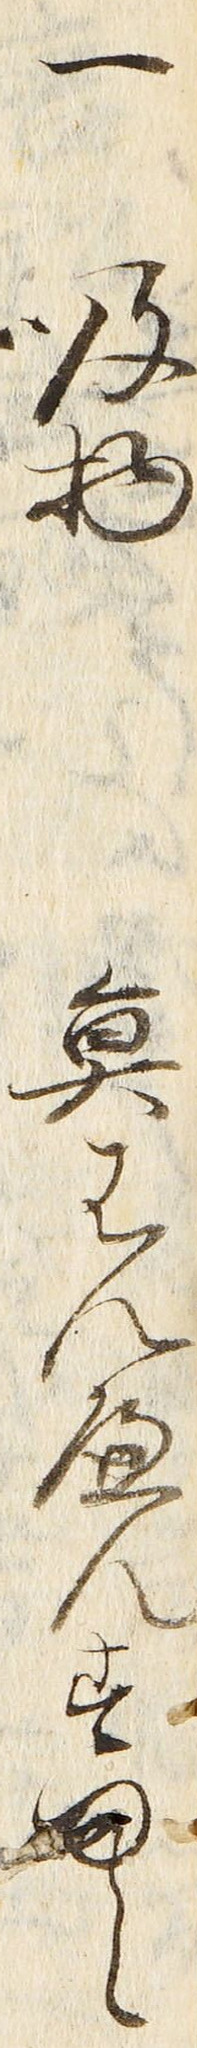一吸物魚はんへんすまし
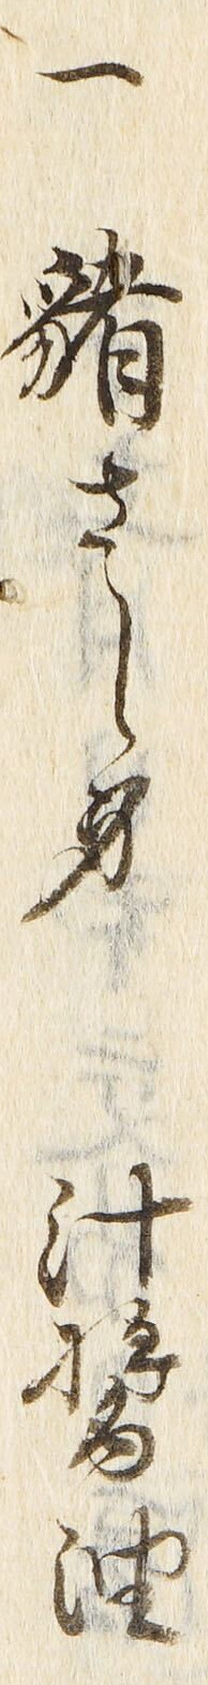一𧳯さし身汁醤油
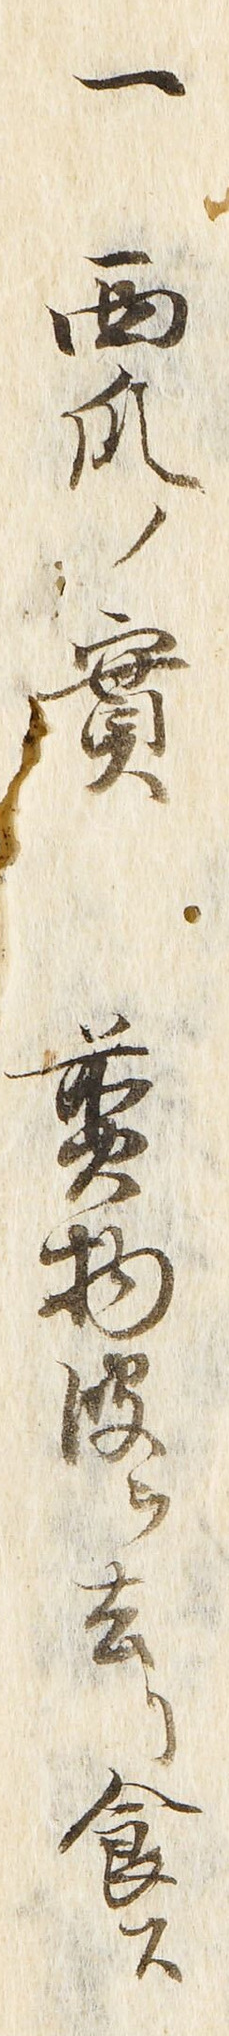一西瓜ノ実煎物皮を去り食す
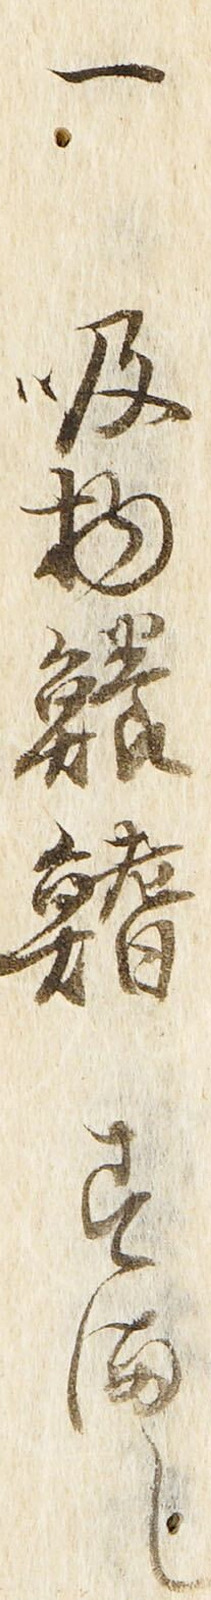一吸物鱶鰭すまし

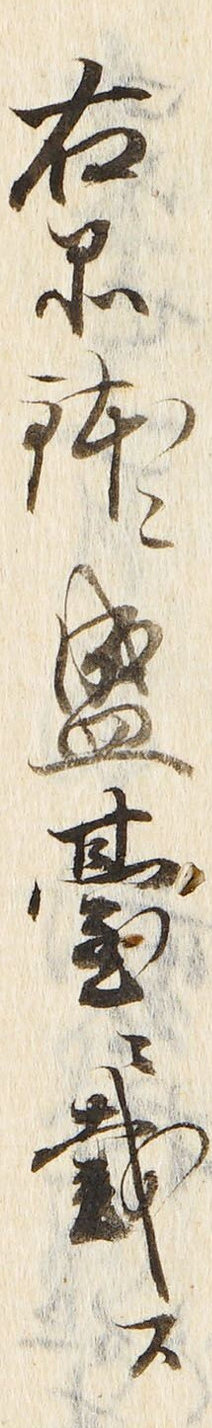右品躰を盛台に載す
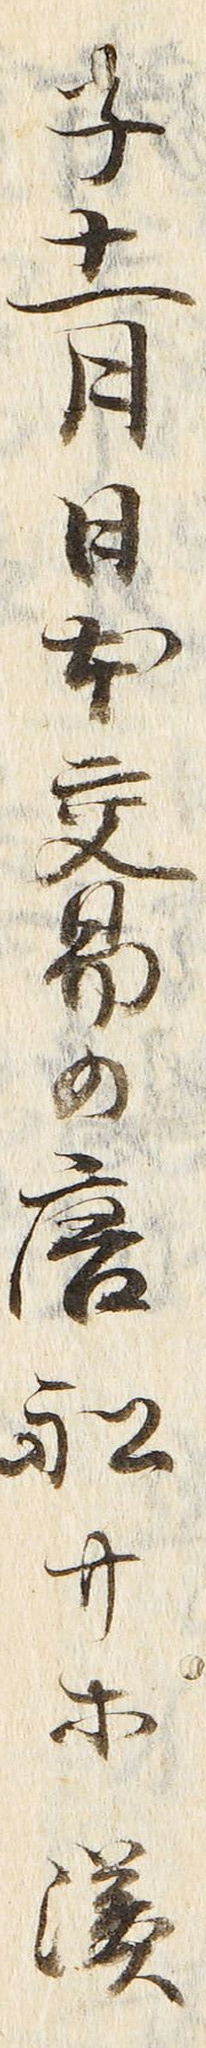子十一月日本交易の唐船サホ湊
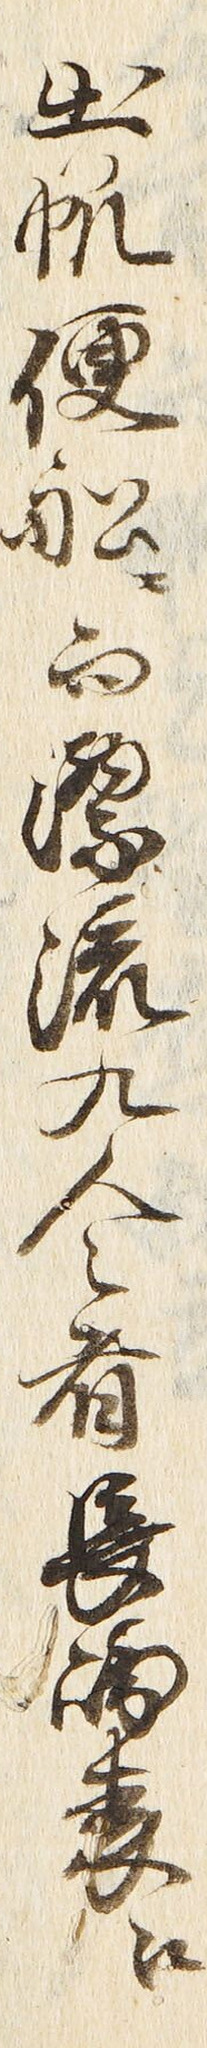出帆便船に而漂流九人之者長崎表え
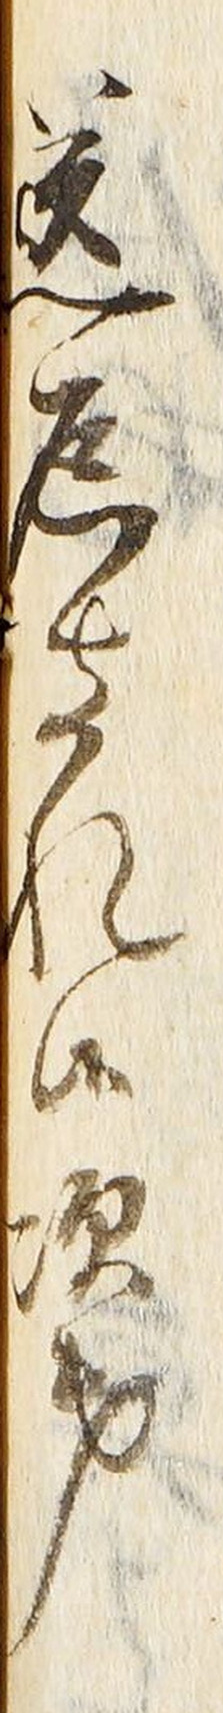送返され候次第
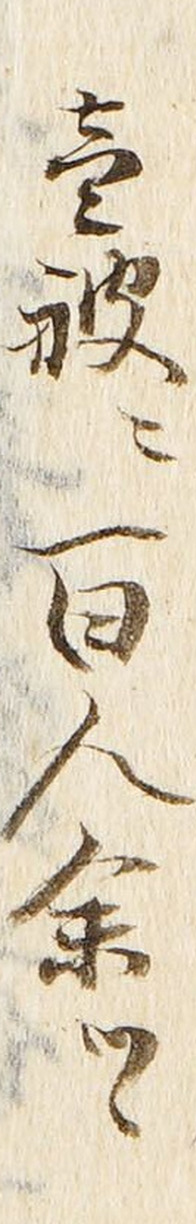壱艘に百人余ツヽ
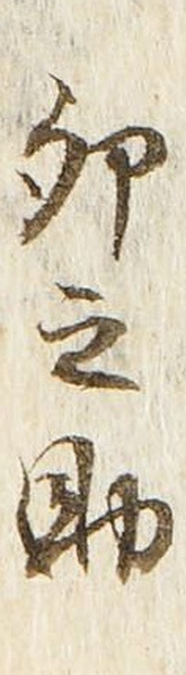利之助
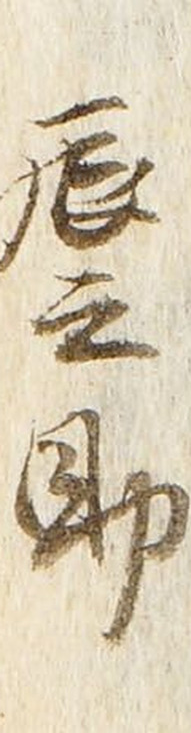利之助
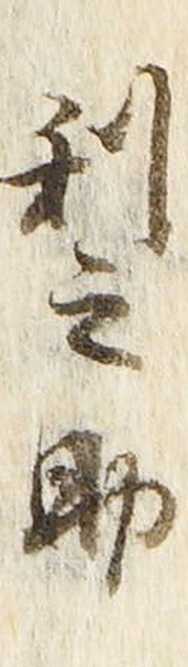利之助

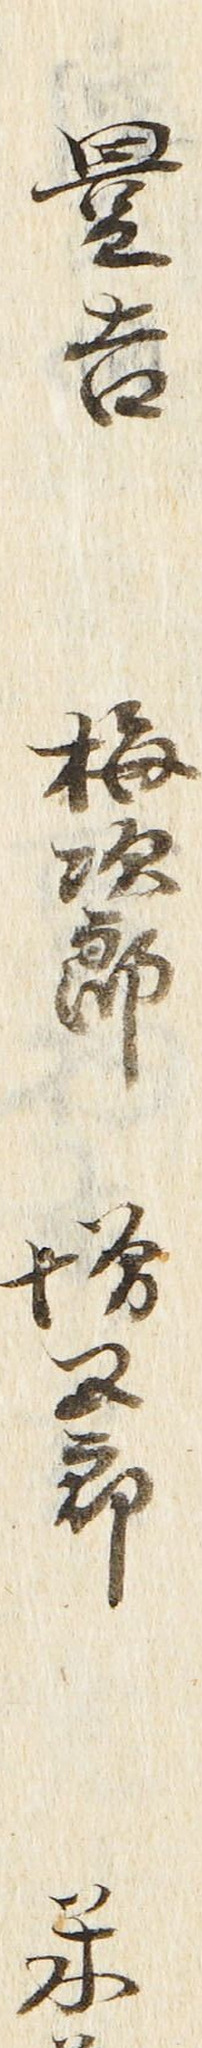量吉梅次郎増五郎米蔵
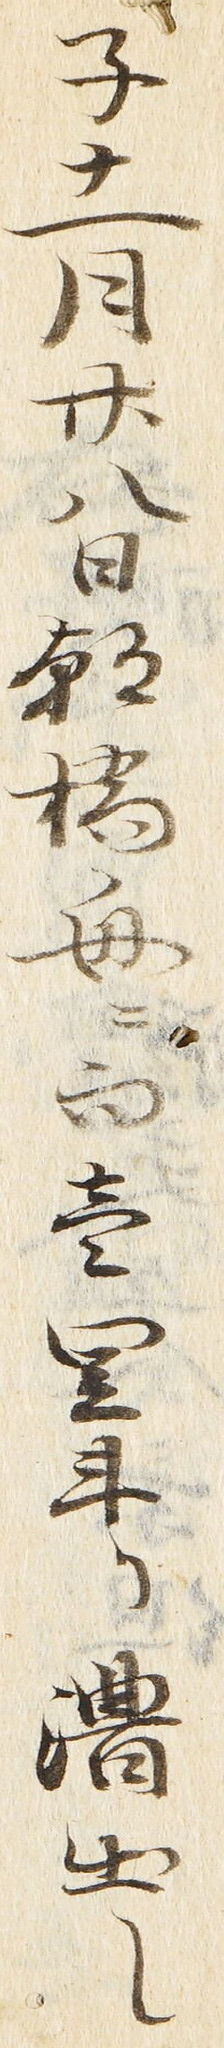子十一月廿八日朝橋舟に而壱里計り漕出し
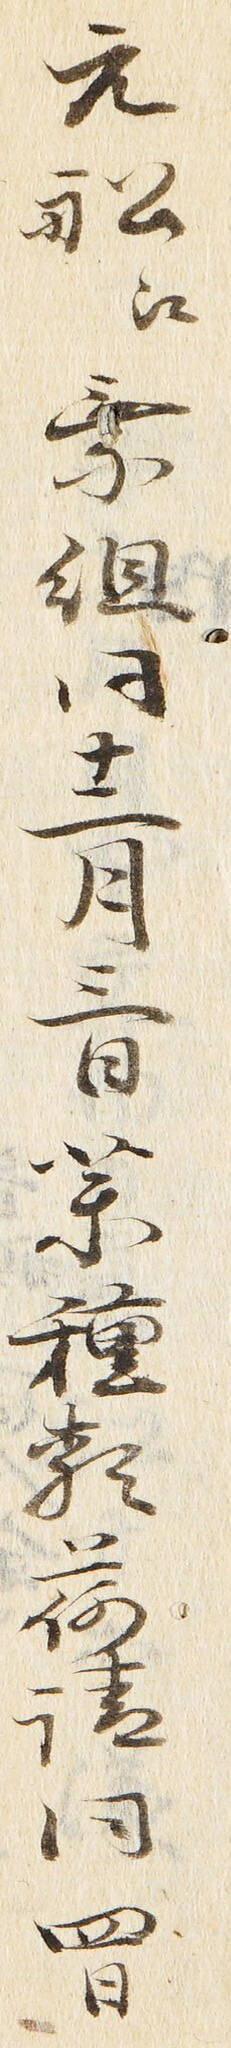元船え乗組同十二月三日薬種類荷請同四日
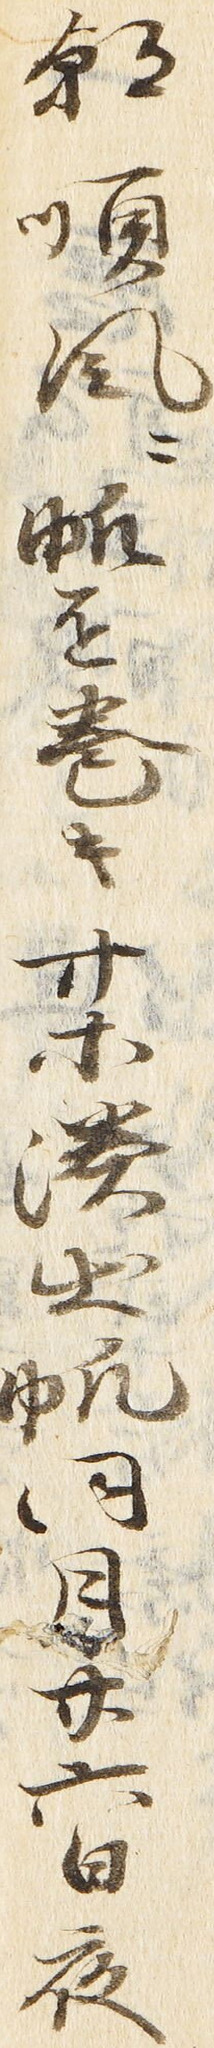朝順風に帆を巻きサホ湊出帆同月廿六日夜
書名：唐物語
